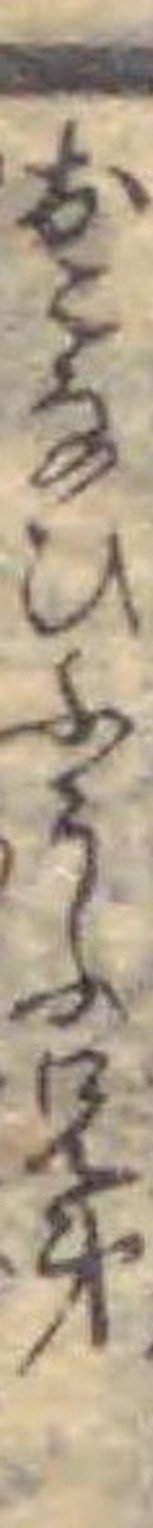おこなひふうふ兄弟
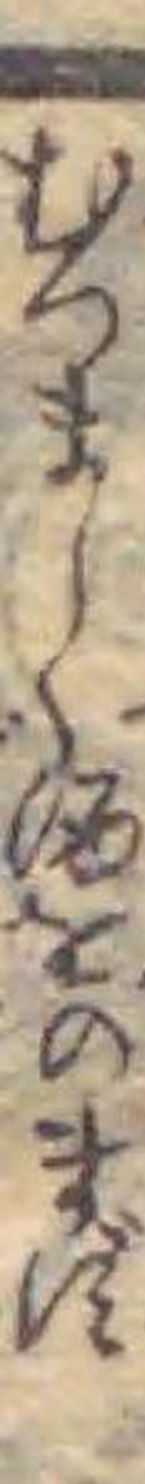むつましく酒をのまず
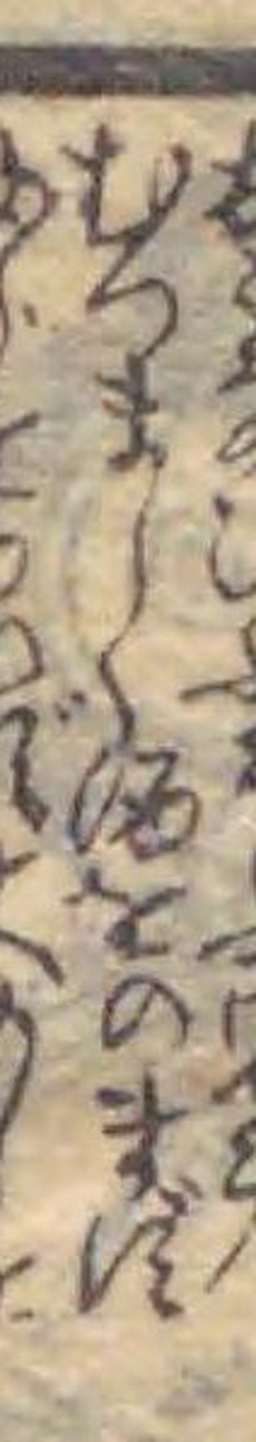女郎をかはず大めしを
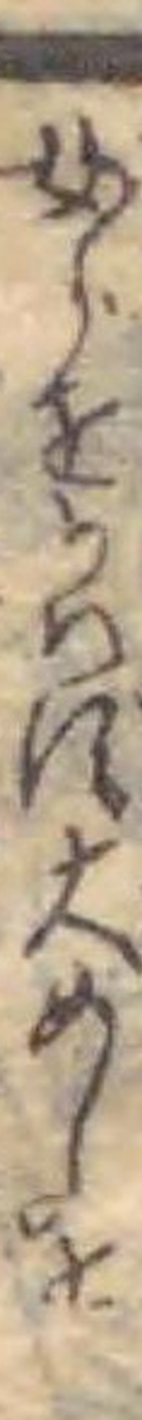女郎をかはず大めしを
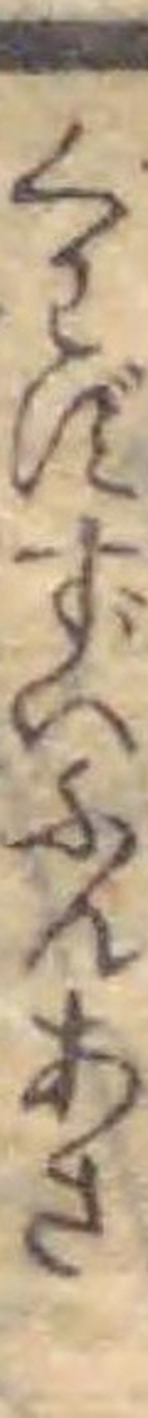くわずずいふんあさ
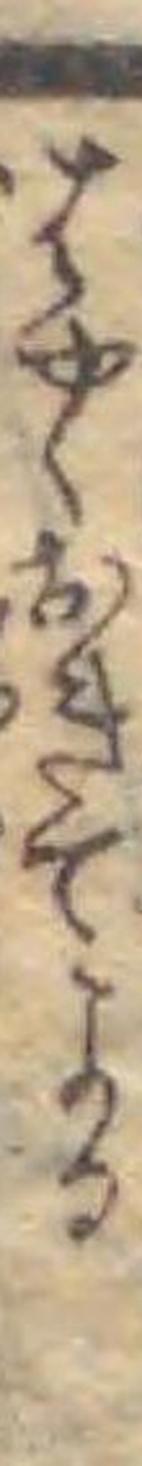はやくおきてよる
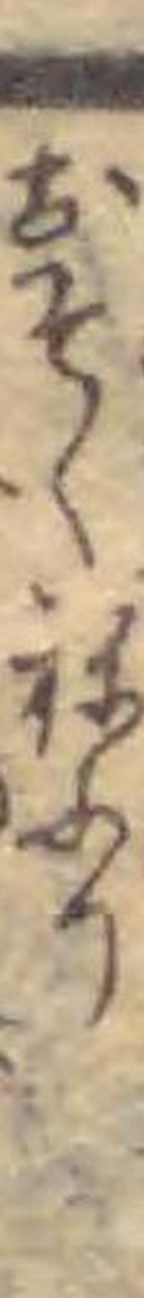おそくねふり
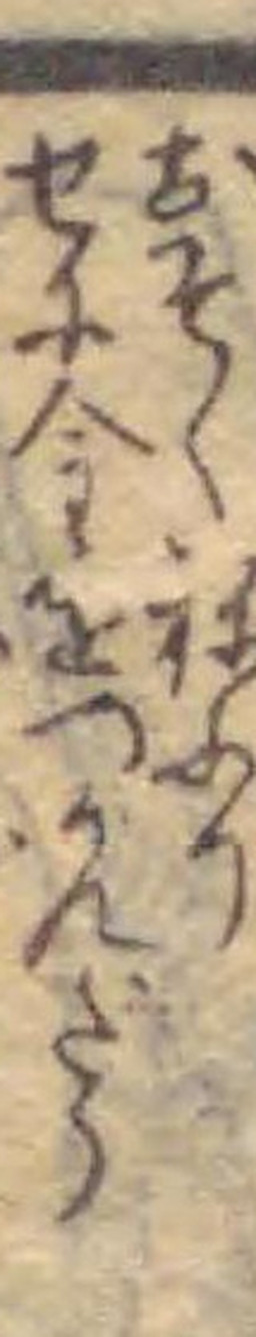せに金をつかんだら
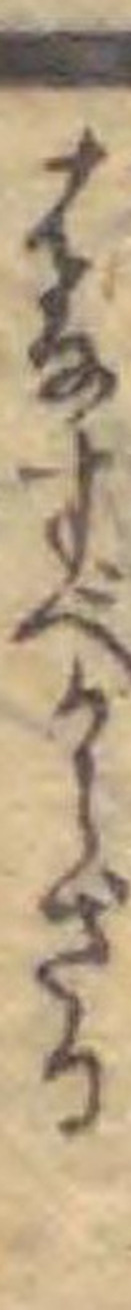はなすべからざる
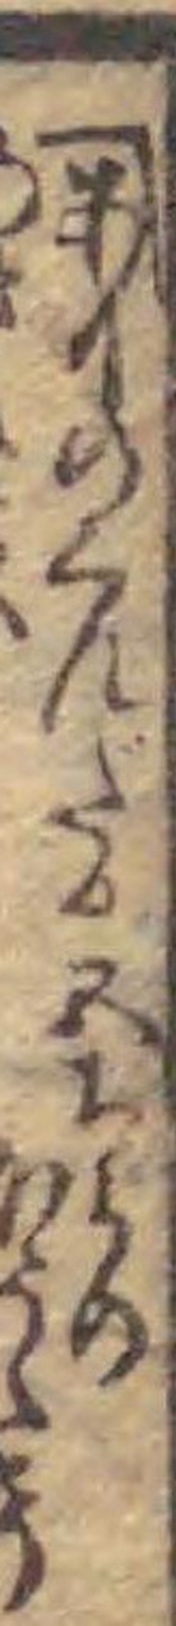〽ありのくんだる五ちうの
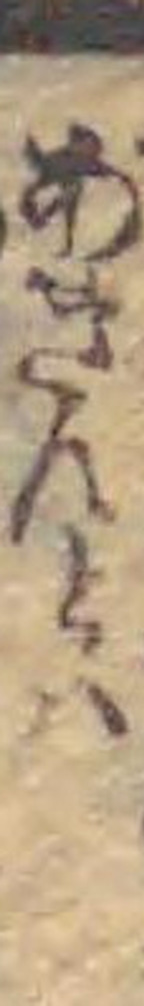あきんとは
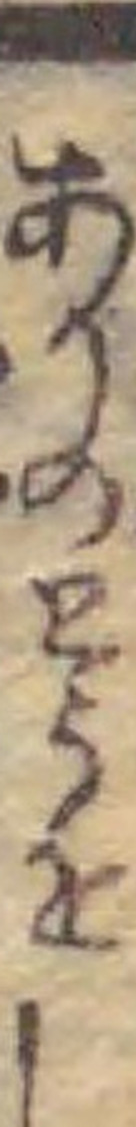ありのとうを
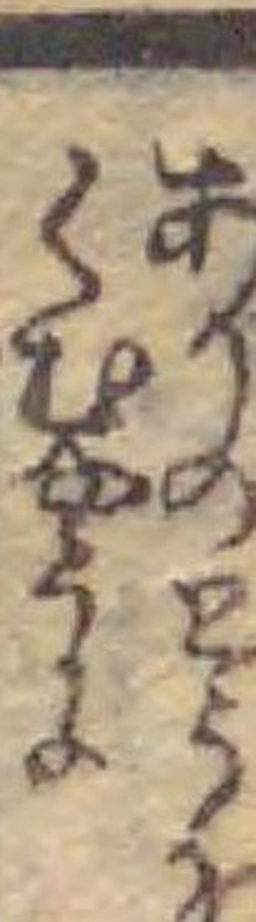くみやうに
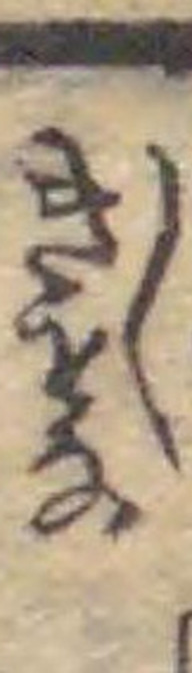きをな
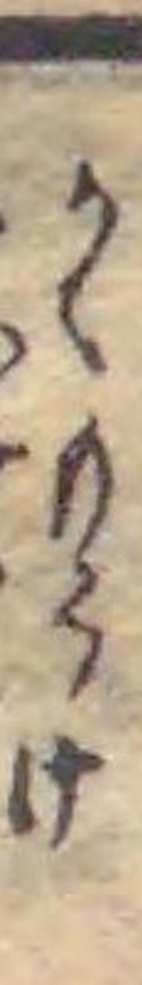かくもうけ
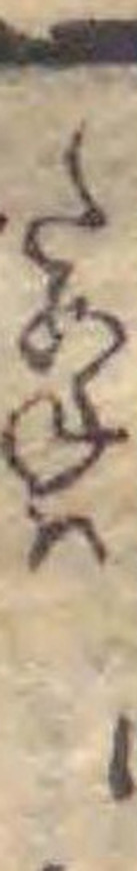ためには
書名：身体開帳略縁起 : 3巻
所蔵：国立国会図書館 National Diet Library, JAPAN
